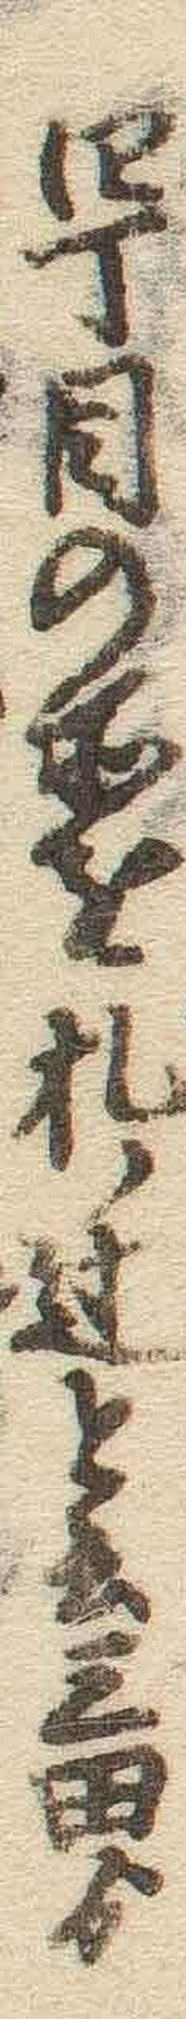四丁目の所を札ノ辻と云三田ゟ
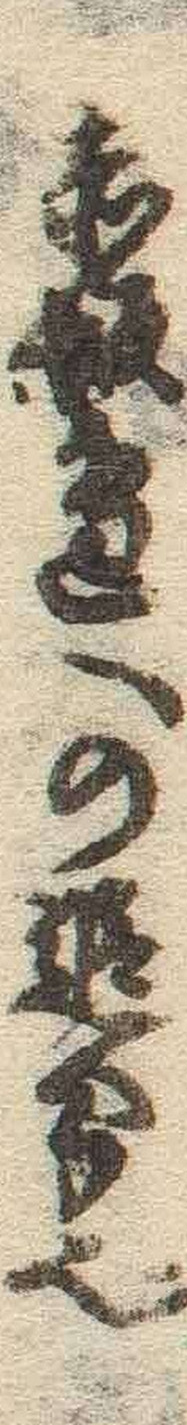赤坂辺への追分也

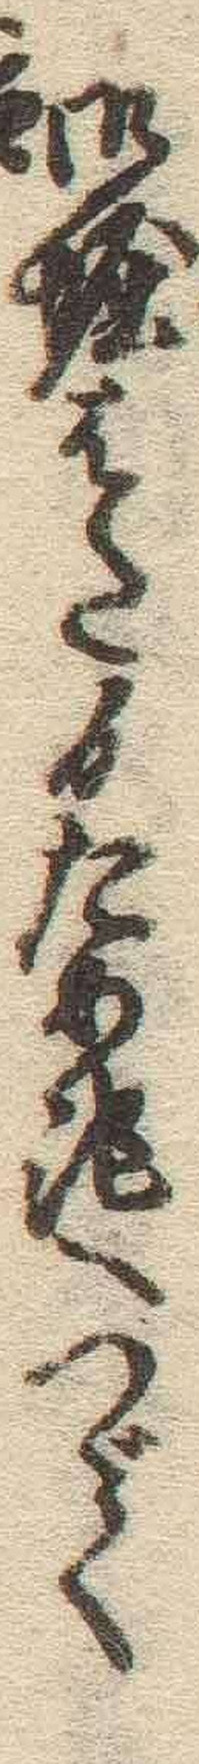御堀はたゟため池へつゞく
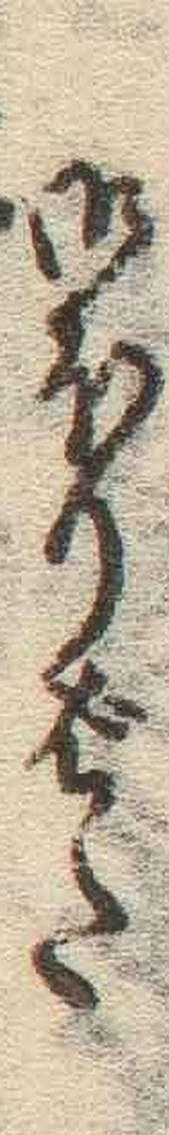御ほりばた
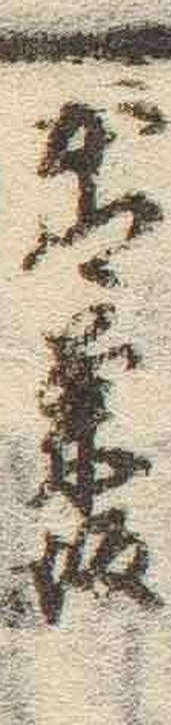本郷菊坂
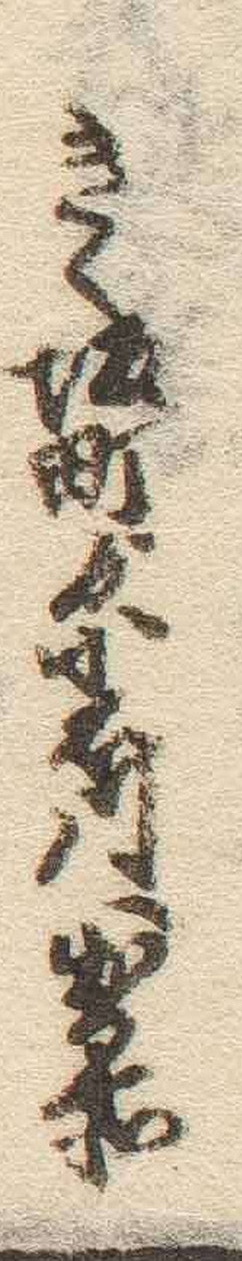田町きく坂町ゟ小石川へ出る所
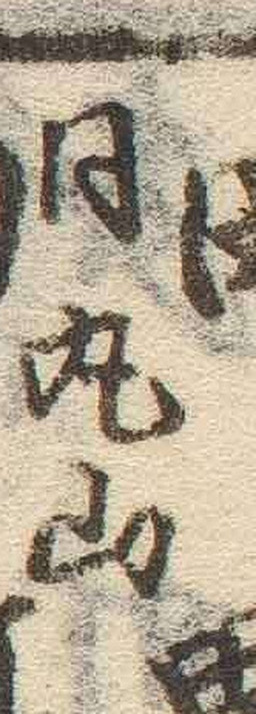同丸山
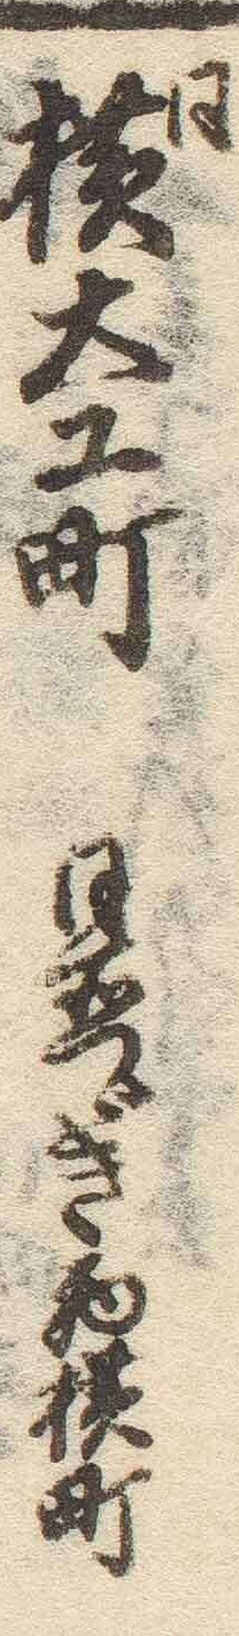横大工町同所つゞき西横町
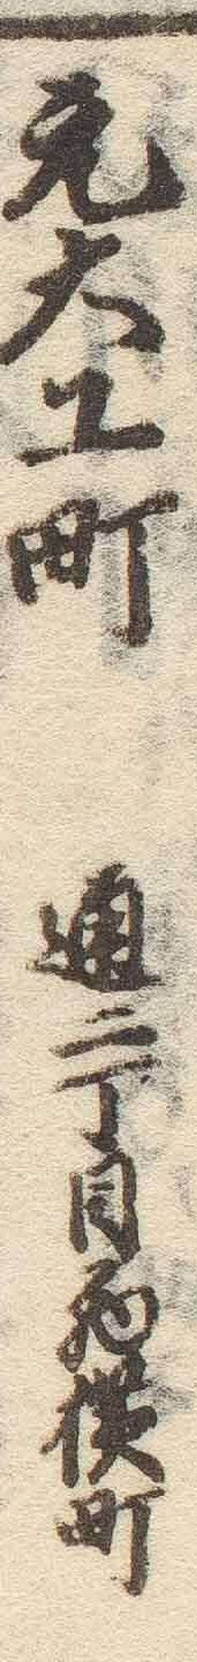元大工町通二丁目西横町
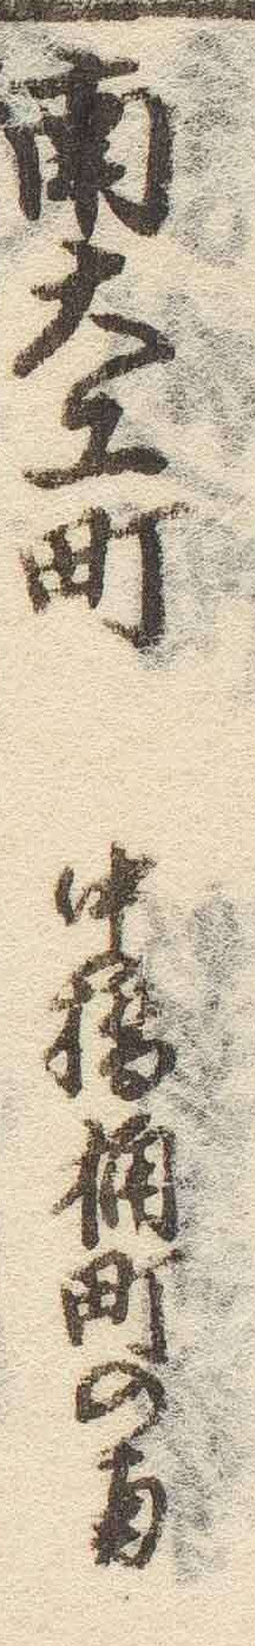南大工町中橋桶町の南
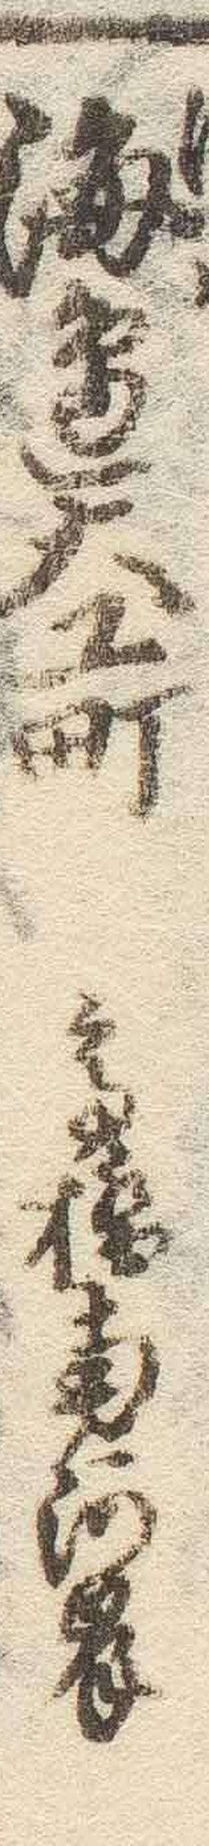海辺大工町高橋南河岸
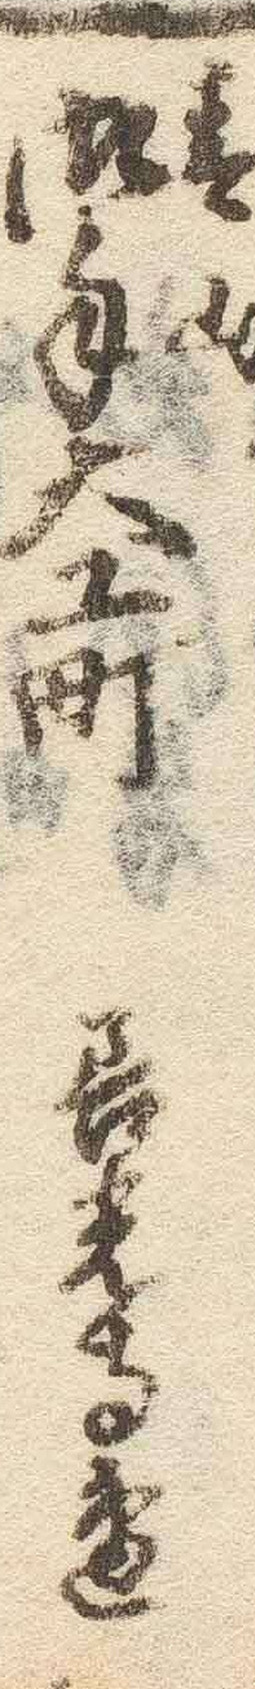御手大工町善光寺辺
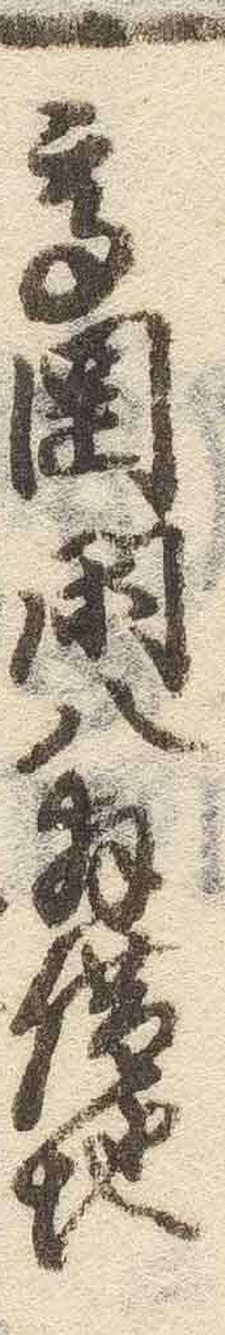高岡閑八拝借地
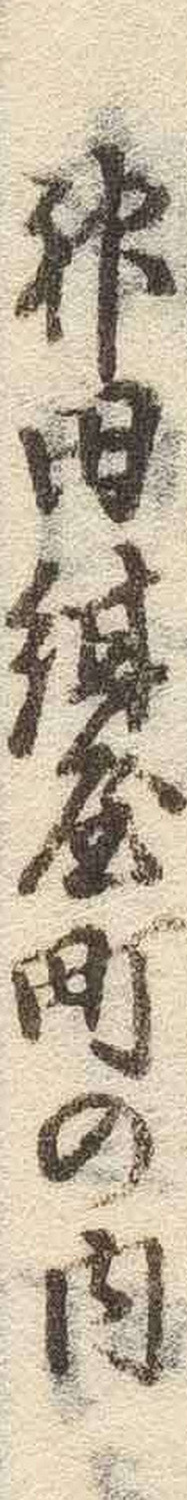神田紺屋町の内
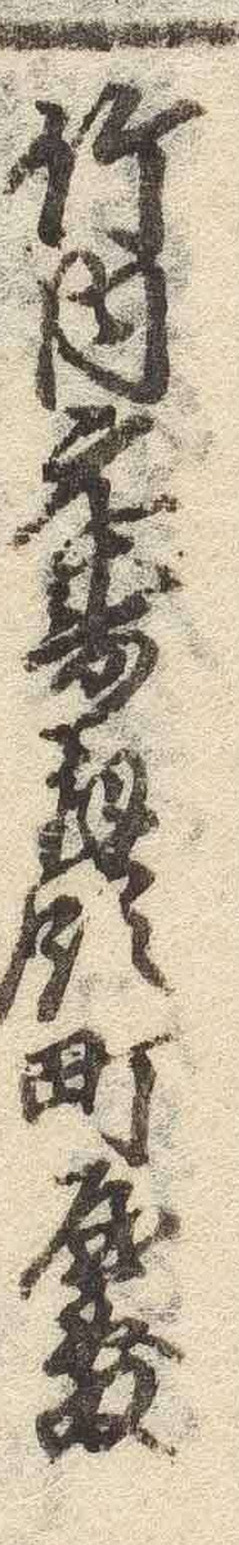竹内元寿拝領町屋敷
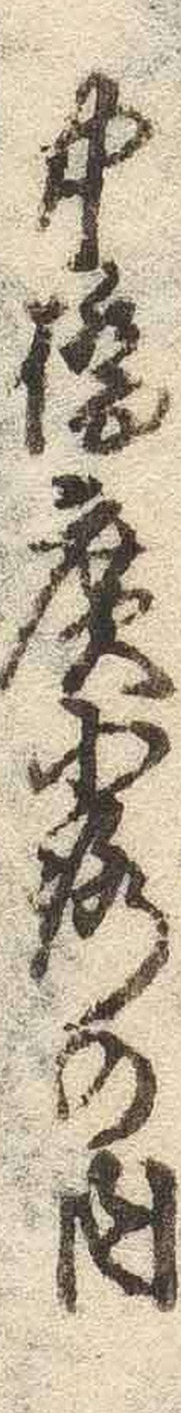中橋広小路の内
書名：江戸町独案内
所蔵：東京学芸大学附属図書館 国文学研究資料館
